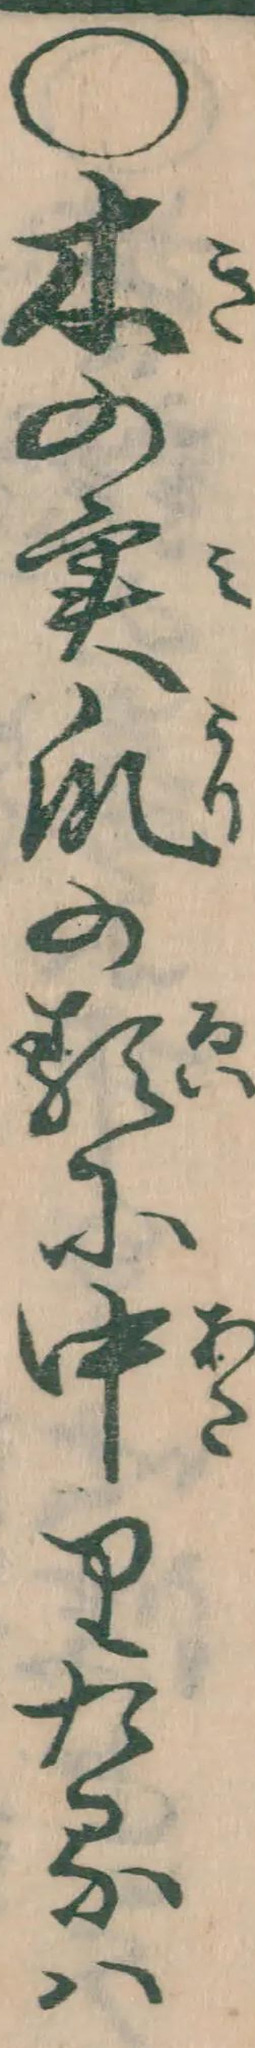〇木の実瓜の類に中りたるは
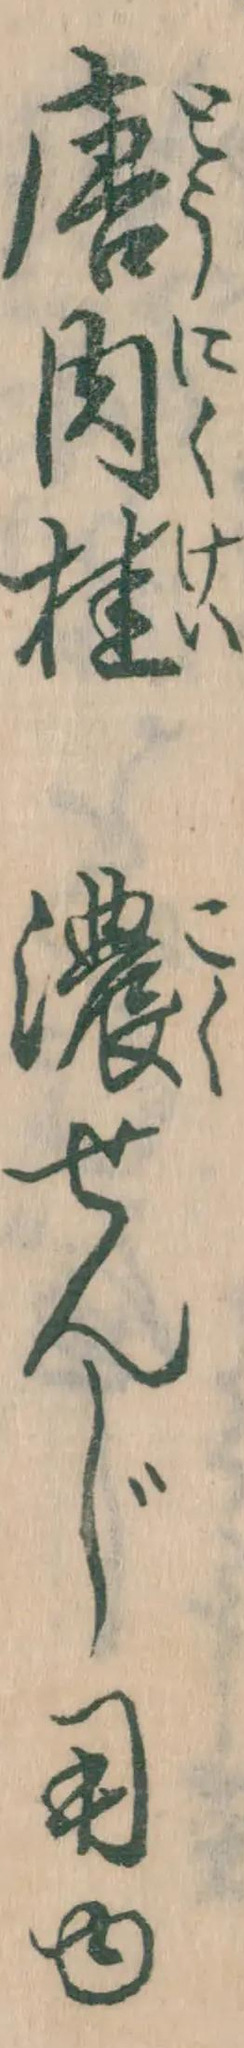唐肉桂濃くせんじ用ゆ
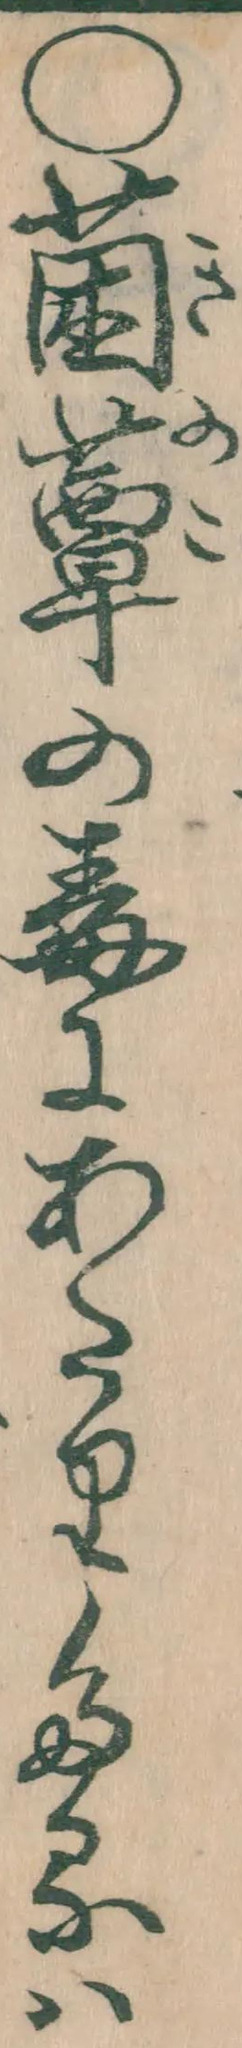〇菌蕈の毒にあたりたるは
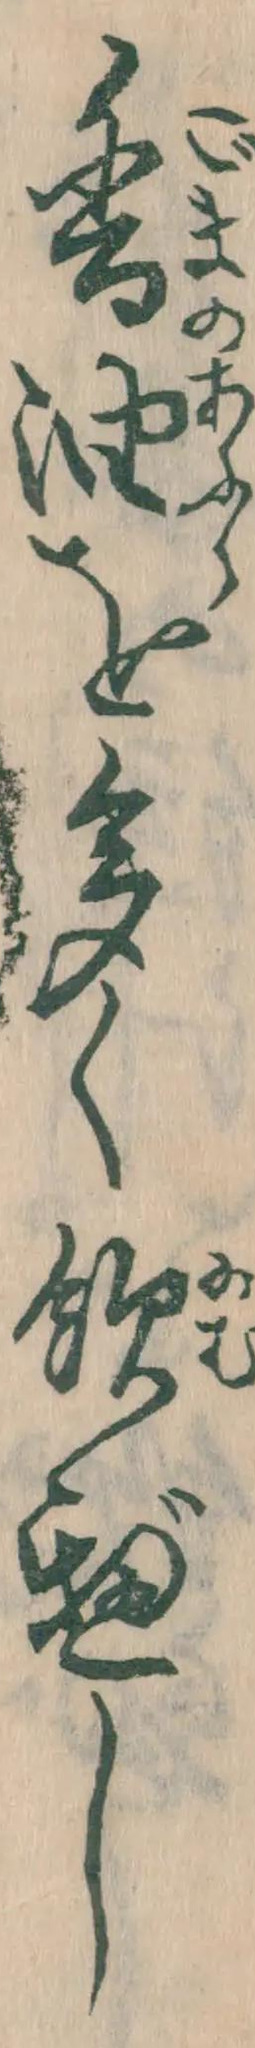香油を多く飲べし
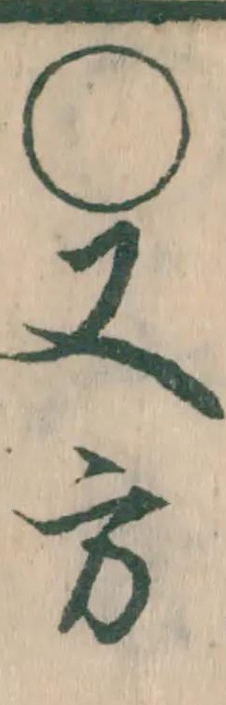〇又方
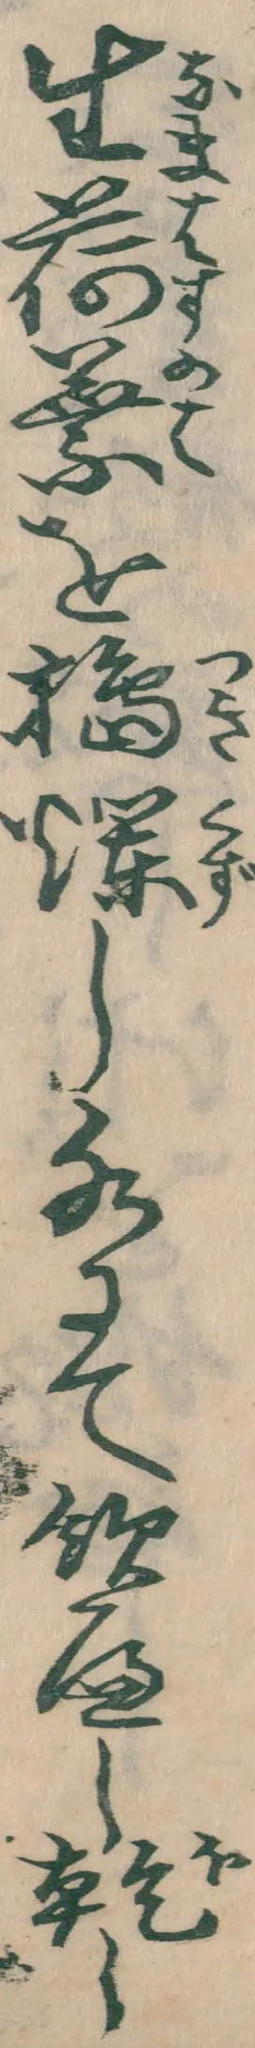生荷葉を搗煠し水にて飲へし乾し
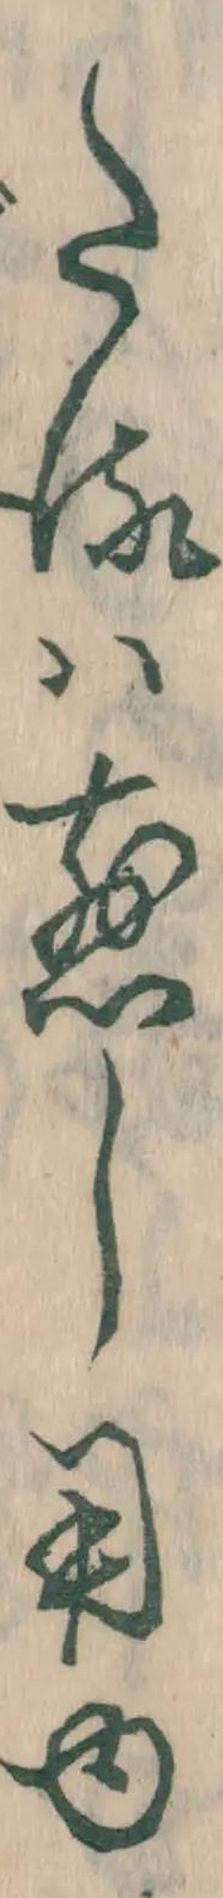たるは煎し用ゆ
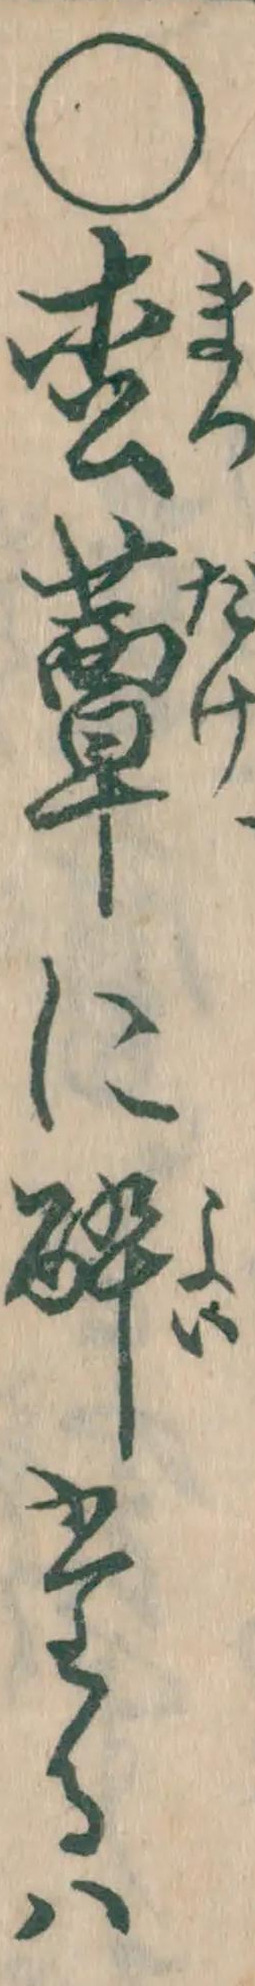〇松蕈に酔たるは

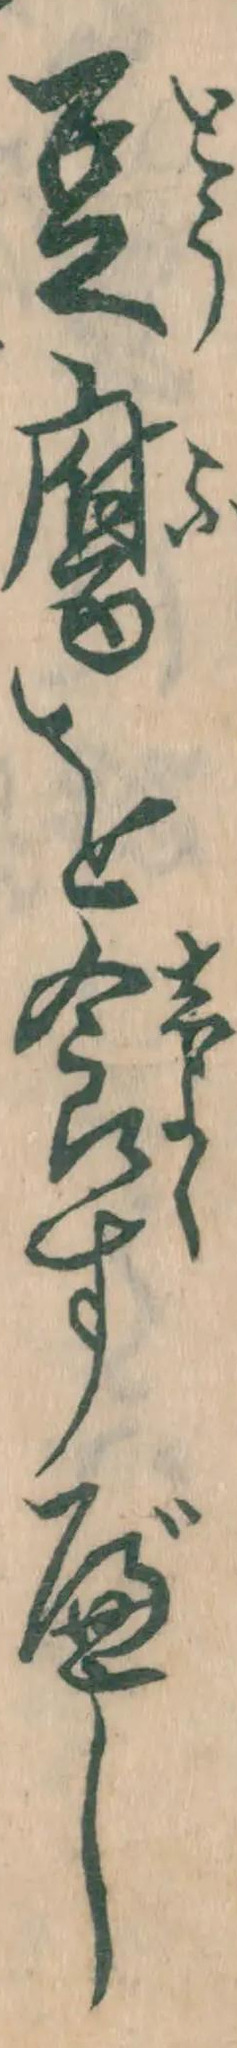豆腐を食すべし
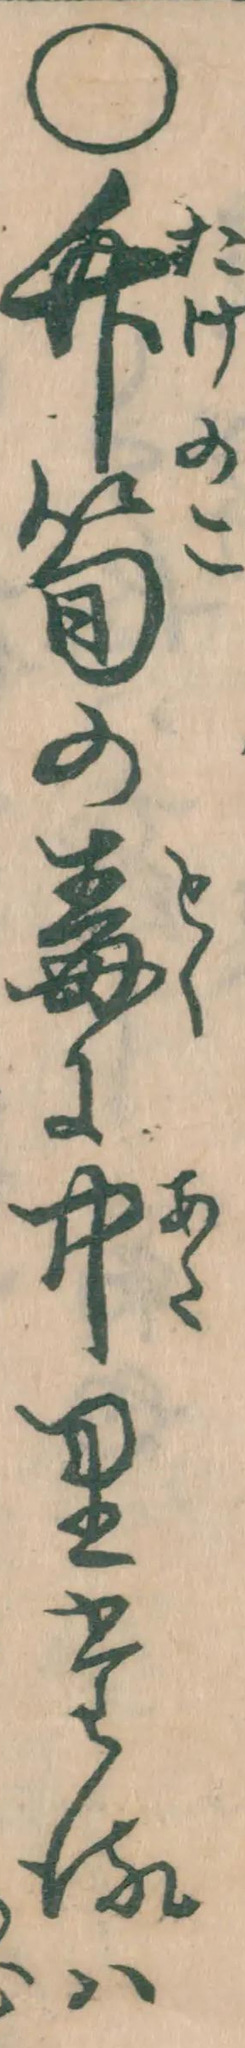〇竹筍の毒に中りたるは
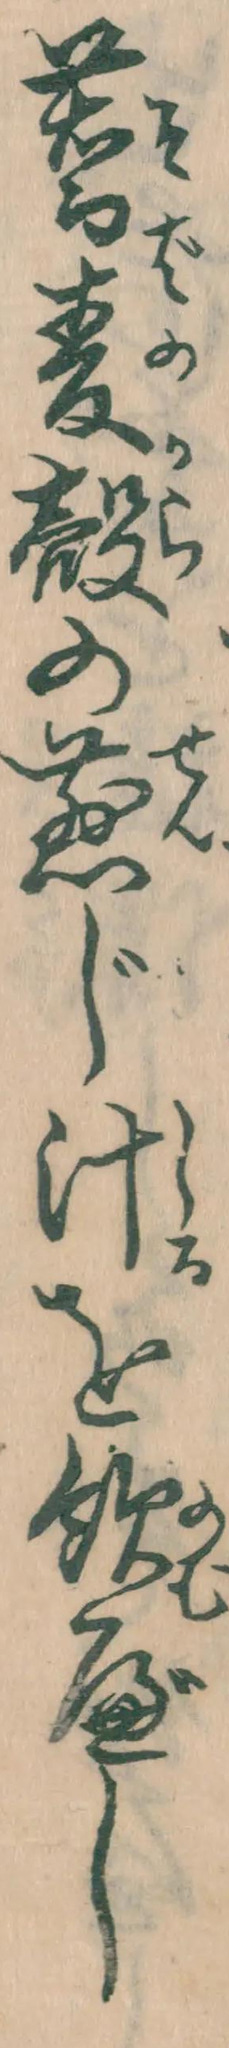蕎麦殻の煎じ汁を飲べし
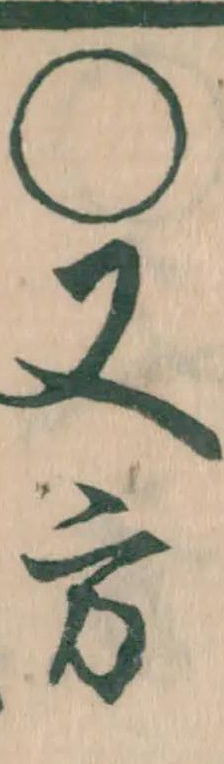〇又方
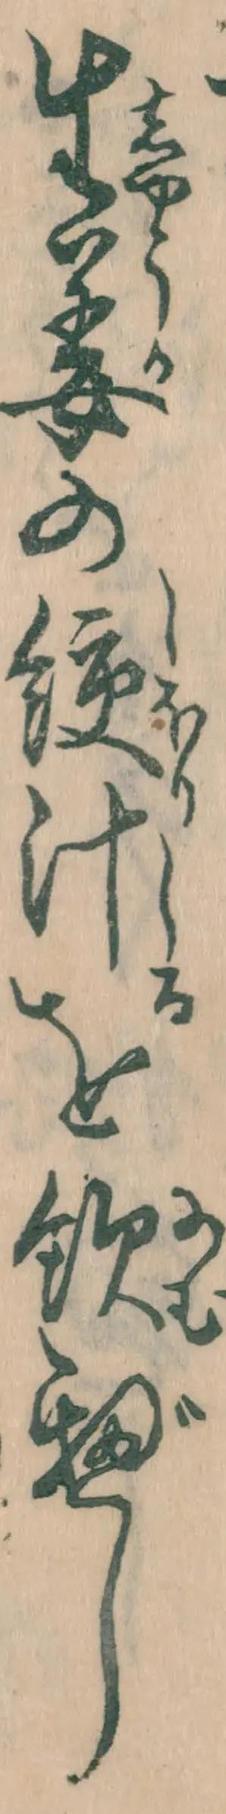生姜の絞汁を飲べし
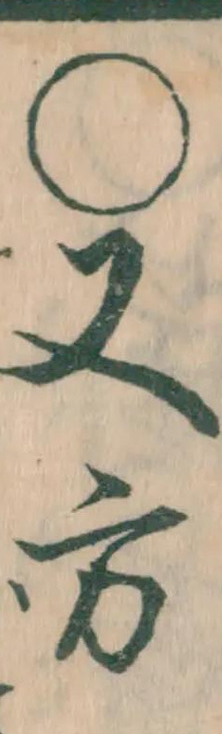〇又方
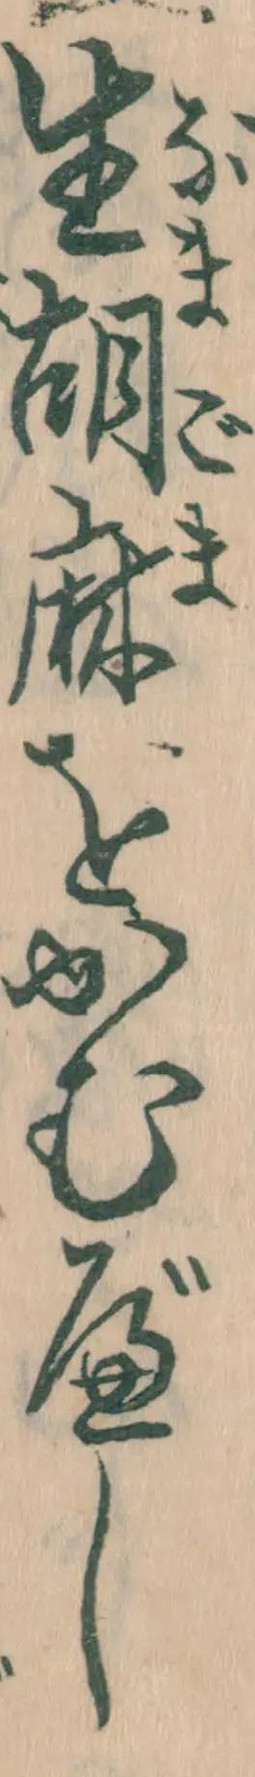生胡麻をかむべし
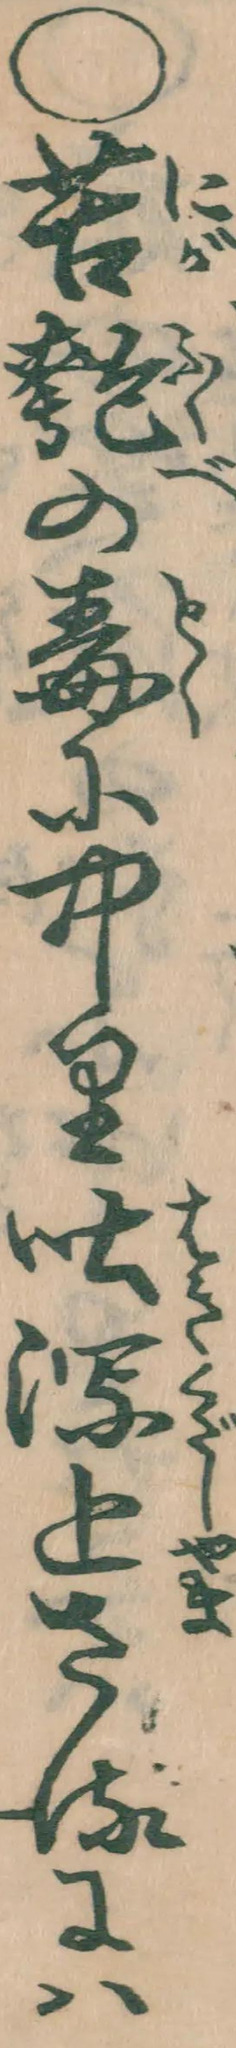〇苦匏の毒に中里吐瀉止さるには
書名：救荒鄙諭
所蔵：国立国会図書館 National Diet Library, JAPAN
